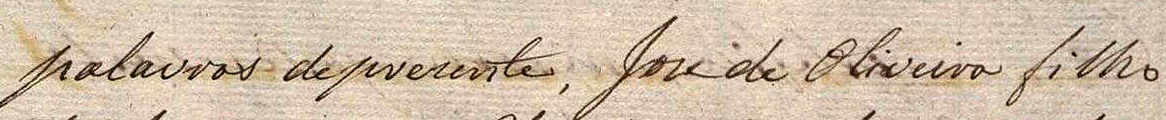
palavras de prezente, Joze de Oliveira filho
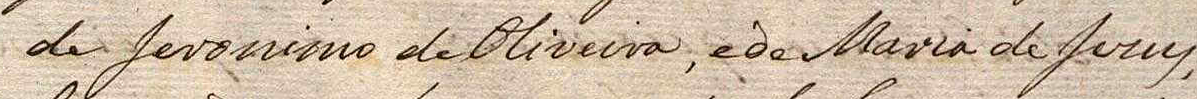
de Jeronimo de Oliveira, e de Maria de Jezus,
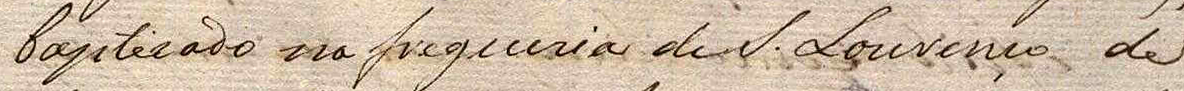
baptizado na freguezia de S. Lourenço de
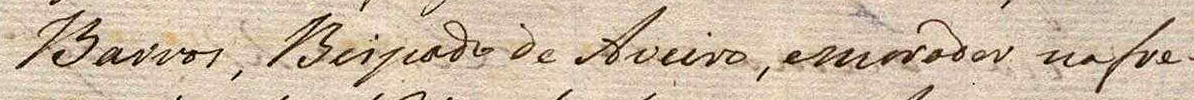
Barros, Bispado de Aveiro, e morador na fre
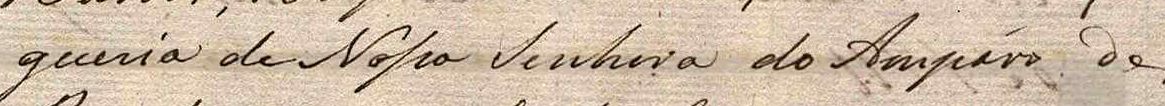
guezia de Nossa Senhora do Ampáro de
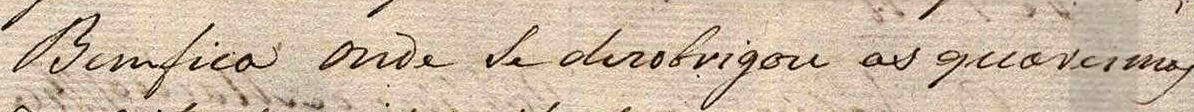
Bemfica onde se dezobrigou as quaresmas
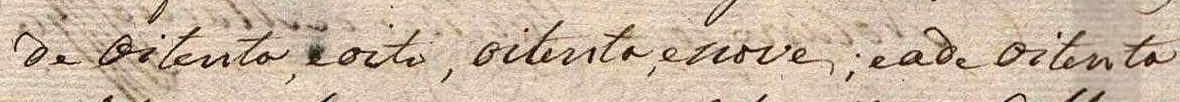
de oitenta, e oito, oitenta, e nove; e a de oitenta
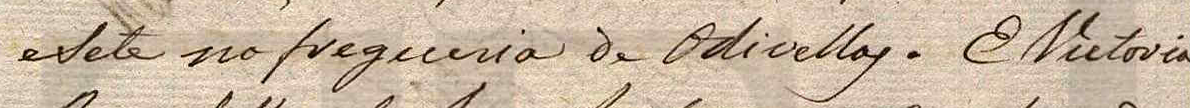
e sete na freguezia de Odivellas. E Victoria
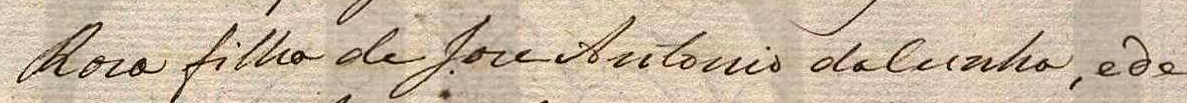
Roza filha de Joze Antonio da Cunha, e de
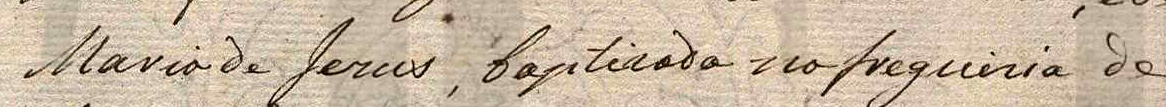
Maria de Jezus, baptizada na freguezia de
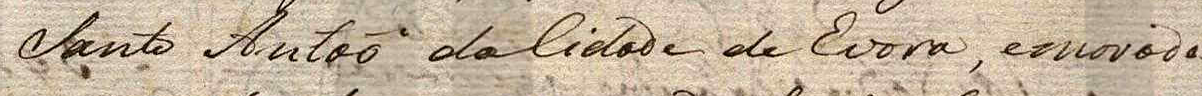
Santo Antaõ da Cidade de Evora, e morado
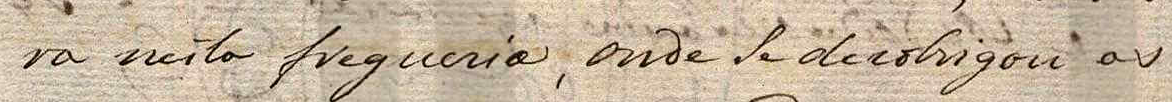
ra nesta freguezia, onde se dezobrigou as
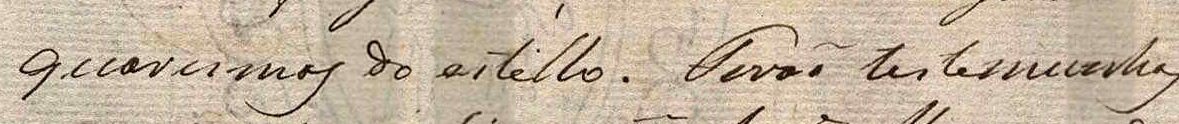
quaresmas do estillo. Foraõ testemunhas
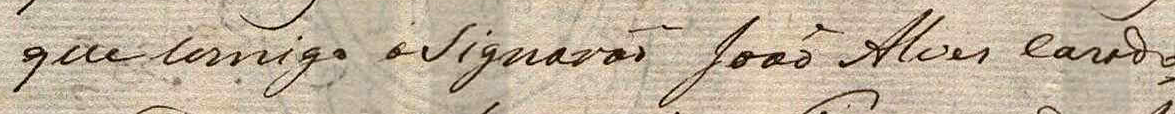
que comigo asignaraõ Joaõ Alves cazado,
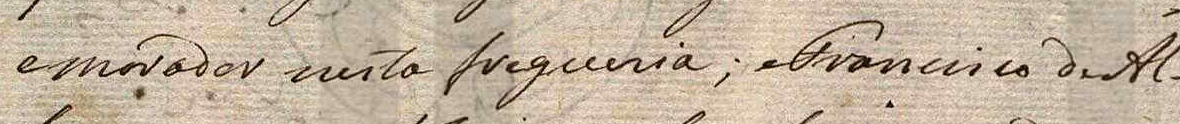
e morador nesta freguezia; e Francisco de Al
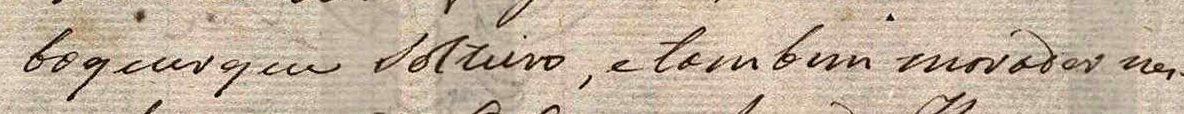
boquerque solteiro, e tambem morador nes
